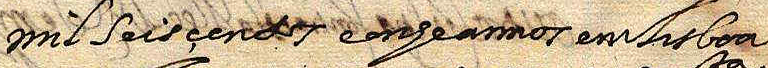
mil seisçentos e onze annos em Lisboa
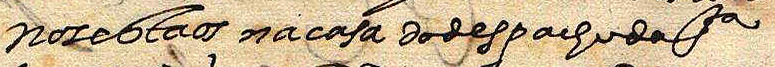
nos estaos na casa do despacho da Sta
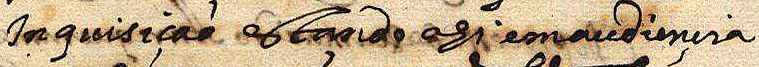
Inquisiçaõ estando ahi em audiençia
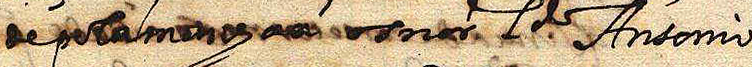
de pola manhaã o snor̄ Ldo. Antonio
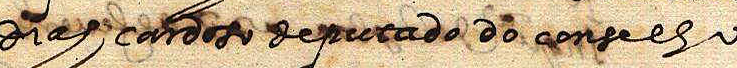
diaz cardoso deputado do conselho
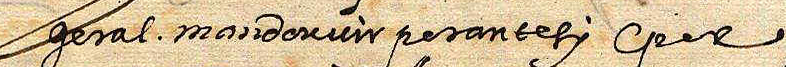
geral. mandou uir perante sy (por
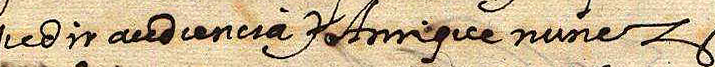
pedir audiencia) Anrique nunez
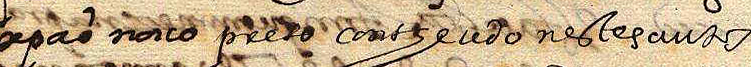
xpaõ nouo preso contheudo nestes autos
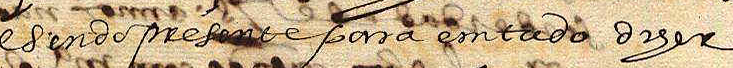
e sendo presente para em tudo dizer
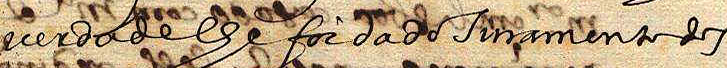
uerdade lhe foi dado Iuramento dos
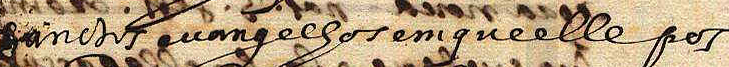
sanctos euangelhos em que elle pos
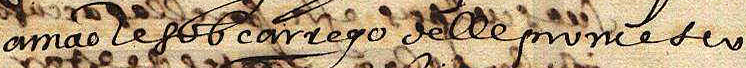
a maõ e sob carrego delle prometeo
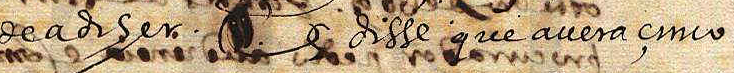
de a dizer. E disse que auera çinco
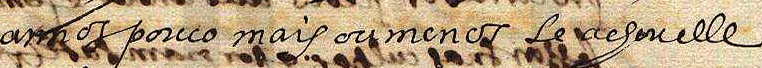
annos pouco mais ou menos se achou elle
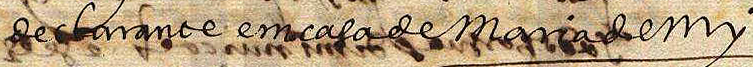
declarante em casa de Maria de My
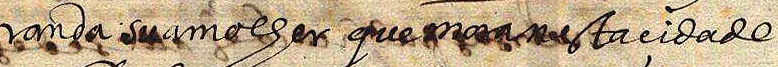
randa sua molher que mora nesta çidade
